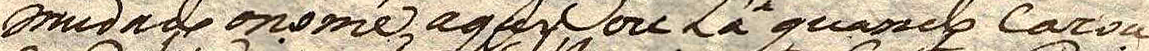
mudado o nome aquy, ou Lá quando cazou
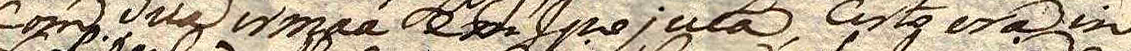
com sua irmaã em Jpojuca, certo era in
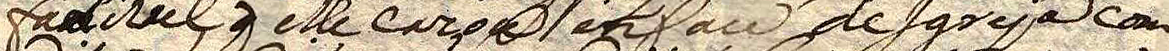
faLivel q̄ elle cazou infaçe de Jgreja com
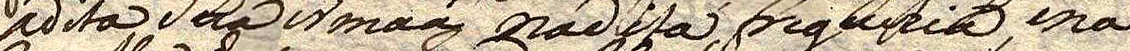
a dita sua irmaã na dita freguezia, e na
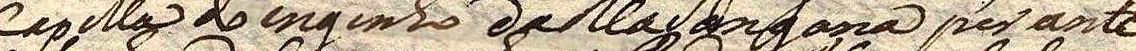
Capella do engenho da Masangona perante
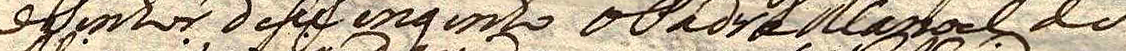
o Senhor desse engenho o Padre Manoel de
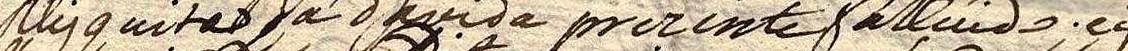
Misquita ja da vida prezente fallecido; e is
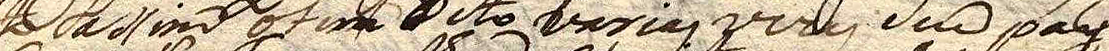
to assim o tem dito varias vezes seu pay
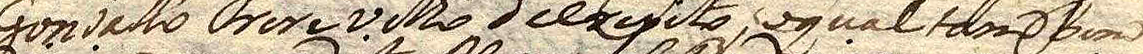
Gonsallo Frere velho decrepito, o qual tambem
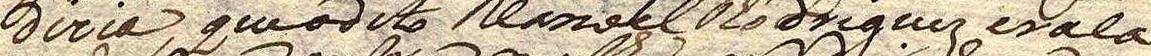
dizia, que o dito Manoel Rodriguez era ca
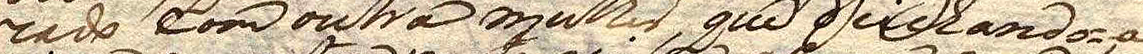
zado com outra mulher, que deichando=a
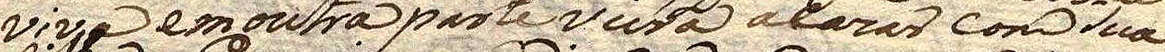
viva em outra parte viera a cazar com sua
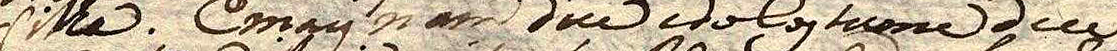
filha. e mais nam diçe e do Costume dice
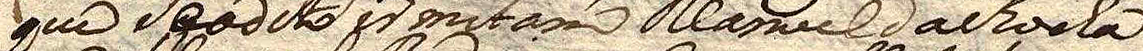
que se o dito irmitam Manoel da Rocha
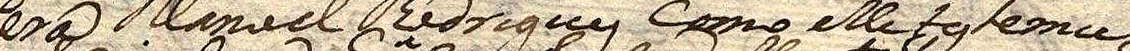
era Manoel Rodrigues Como elle testemu
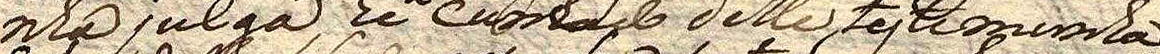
nha julga, hé cunhado delle testemunha,
